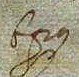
tpꝯ
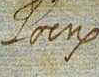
locus
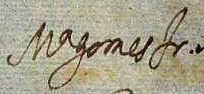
Ma gomes Jr.
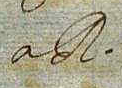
a R.
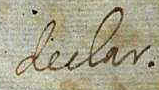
declar
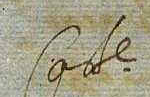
Cost.e
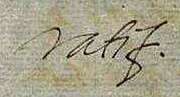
ratif.
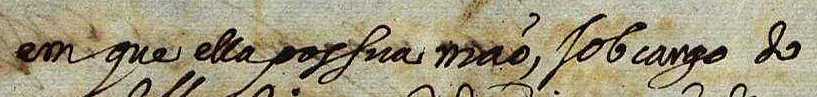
em que ella pos sua maõ, sob cargo do
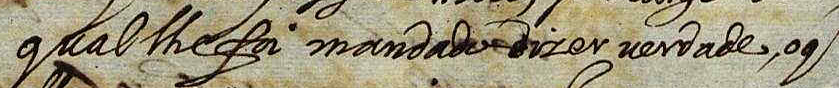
qual lhe foi mandado dizer uerdade, o q̄
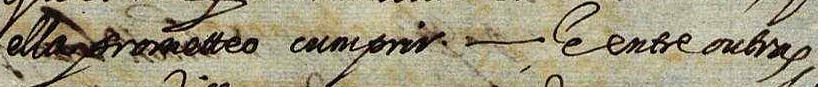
ella prometteo cumprir – E entre outras
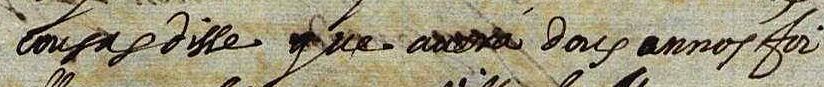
cousas disse que auerá dous annos foi
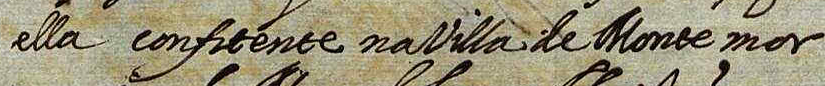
ella confitente na Villa de Montemor
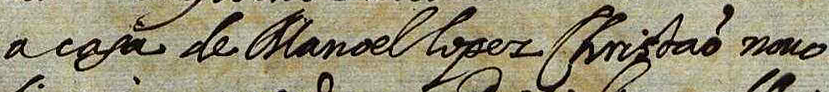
a casa de Manoel lopez Christaõ nouo
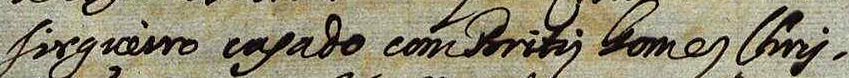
sirgueiro casado com Britiz Gomez Chris
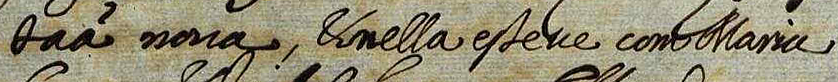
taā noua, & nella esteue com Maria
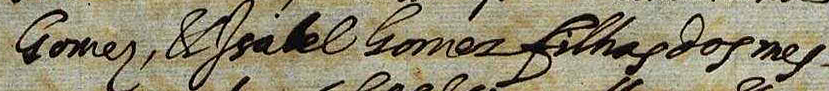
Gomez, & Jsabel Gomez filhas dos mes
